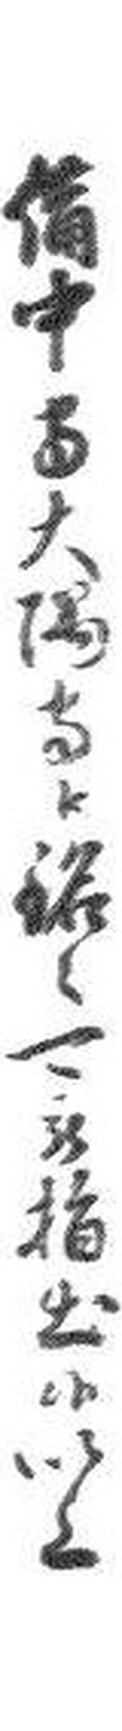備中守大隅守江銘々可被指出候以上

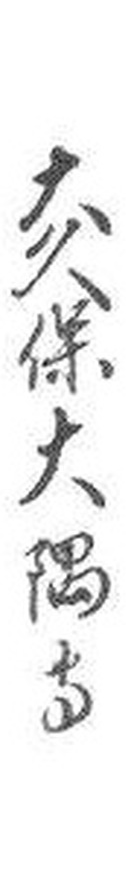大久保大隅守
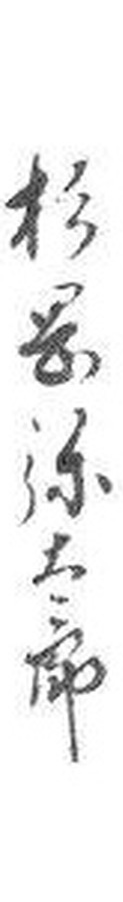杉岡弥太郎
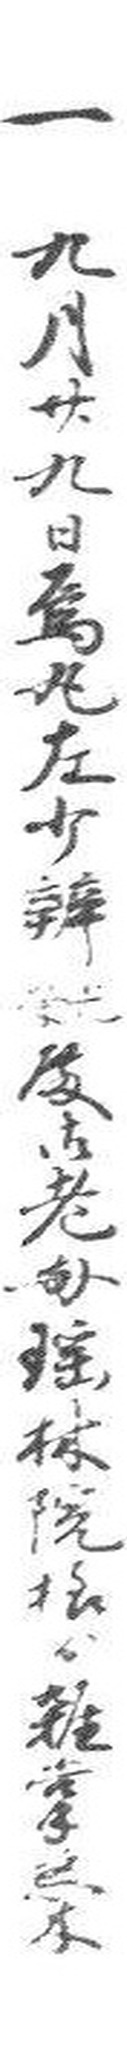一九月廿九日烏丸左少辨光栄殿御老母瑶林院様ゟ雑掌荒木
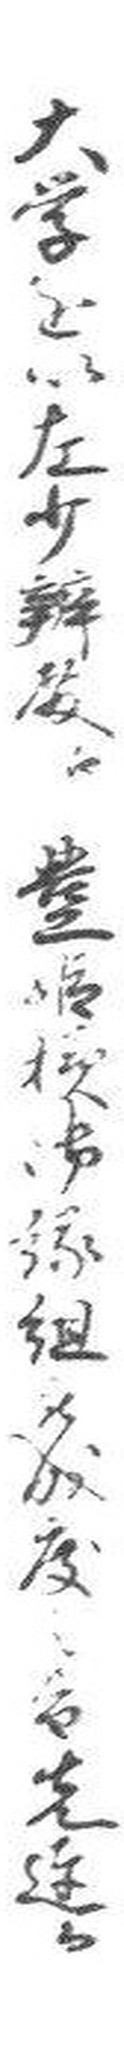大学を以左少辨殿江豊姫様御縁組被成度之旨先達而
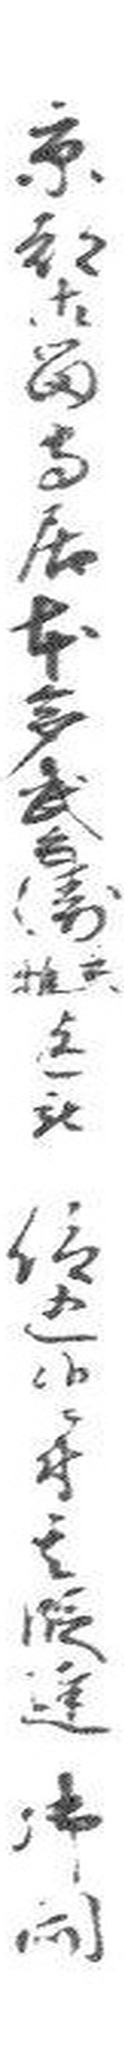京都御留守居本多武兵衛迄被仰込候ニ付其段達御聞
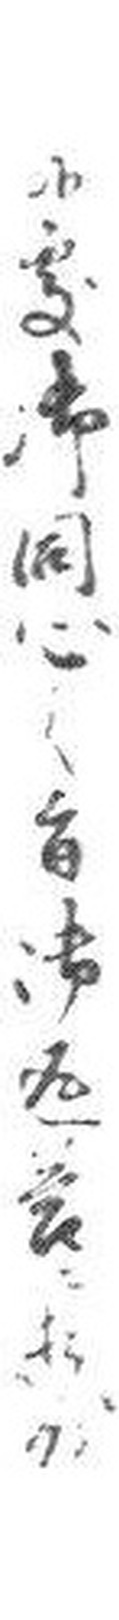候処御同心之旨御返答ニ相成
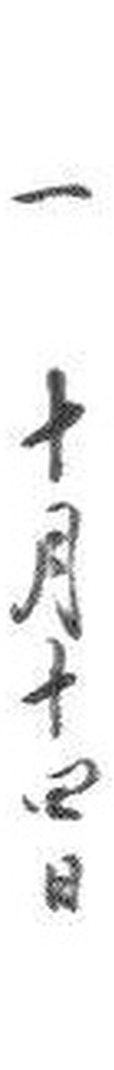一十月十四日
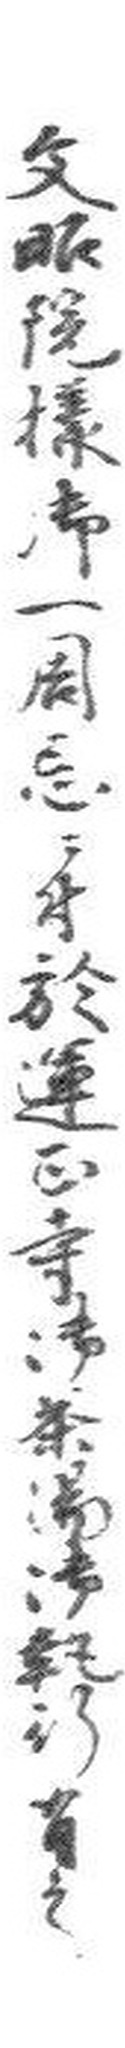文照院様御一周忌ニ付於運正寺御茶湯御執行有之
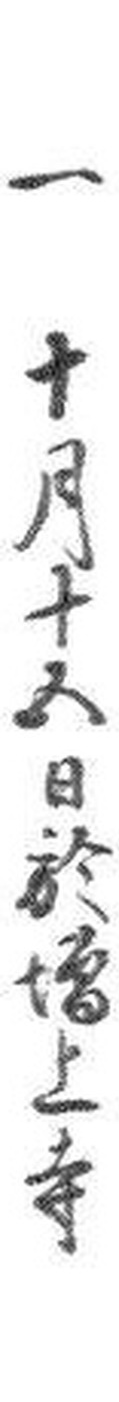一十月十五日於増上寺
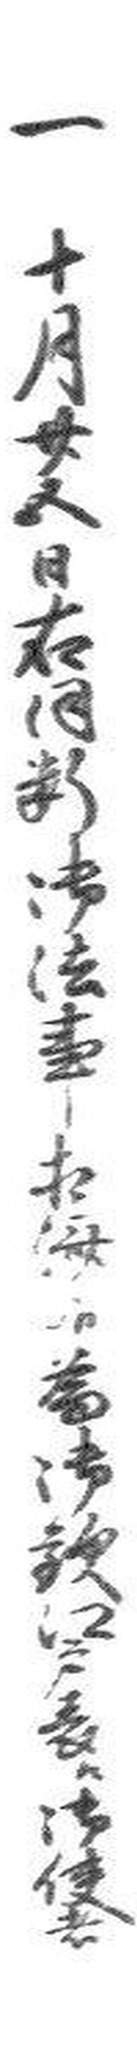一十月廿五日右同断御法事相済候御歓江戸表江御使者
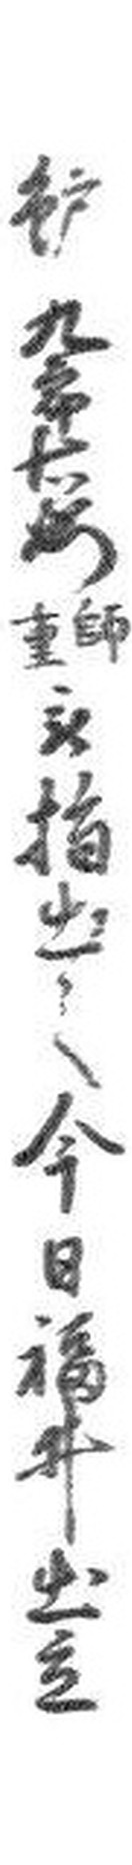鱸九郎右衛門師重被指出之今日福井出立
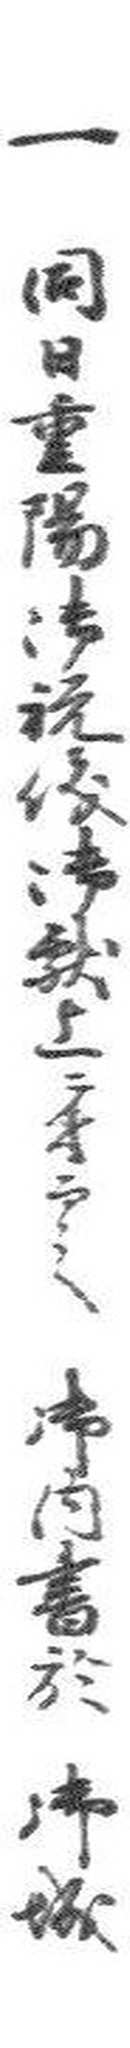一同日重陽御祝献上ニ付而之御内書於御城
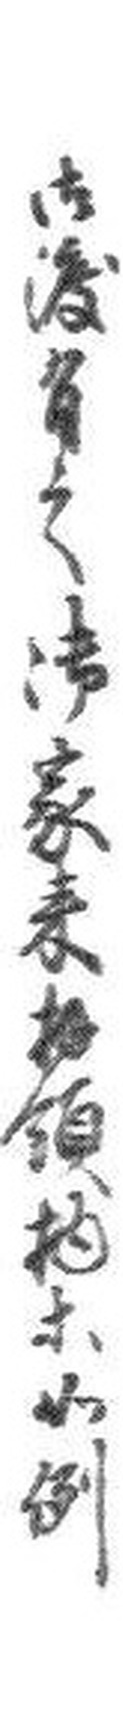御渡有之御家来拝領物等如例
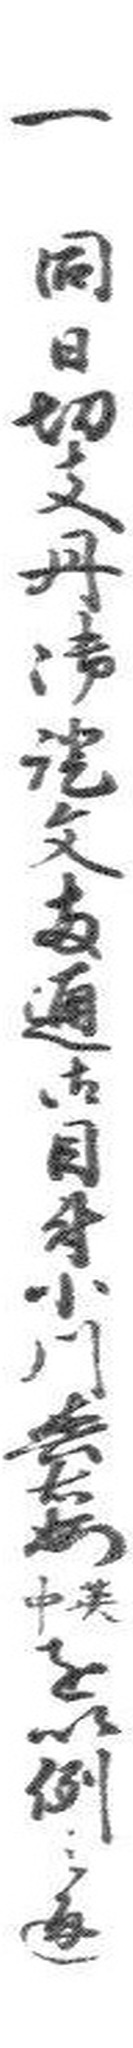一同日切支丹御証文両通御目付小川与右衛門英中を以例之通

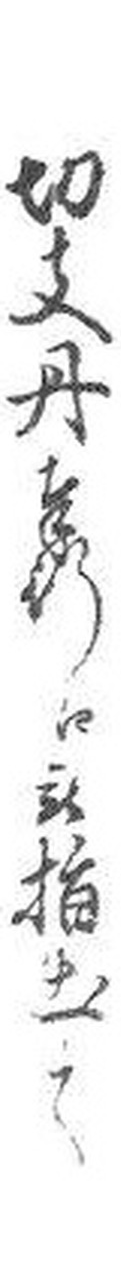切支丹奉行江被指出之
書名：家譜 二十九 吉邦公 従正徳二年到正徳三年
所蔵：福井県文書館 Fukui Prefectural Archives
